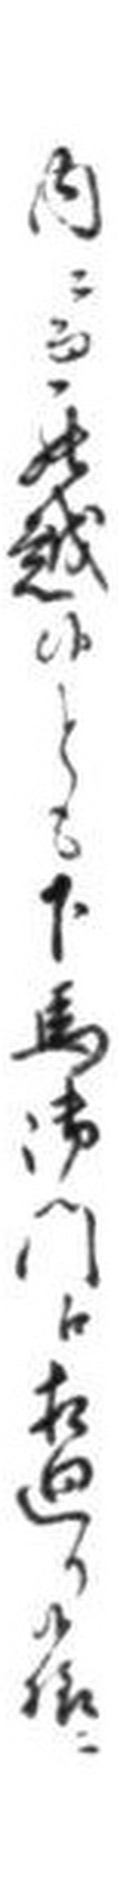内ニ而罷越候とも下馬御門江相廻り候様ニ
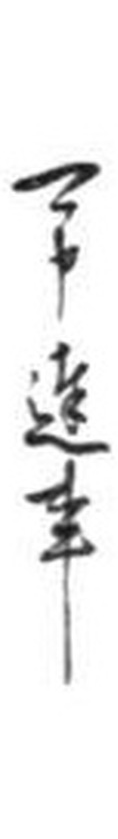可申達事
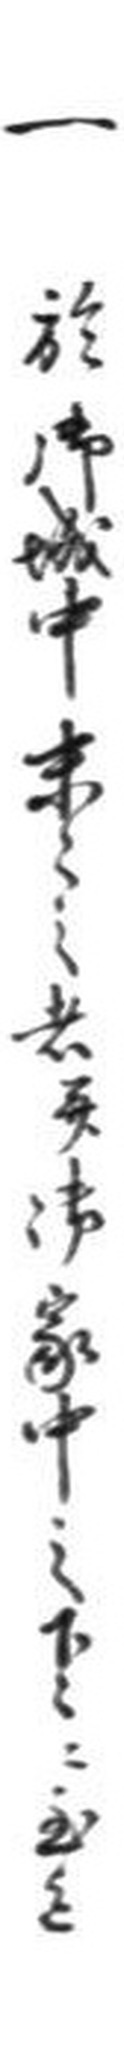一於御城中末々之者并御家中之下々ニ至迄
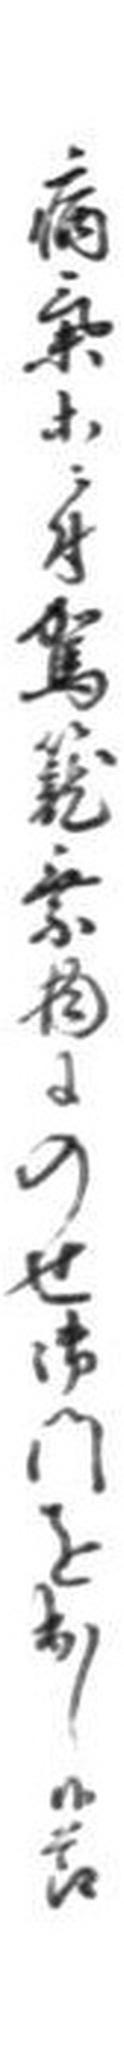病気等ニ付駕籠乗物にのせ御門を出し候節
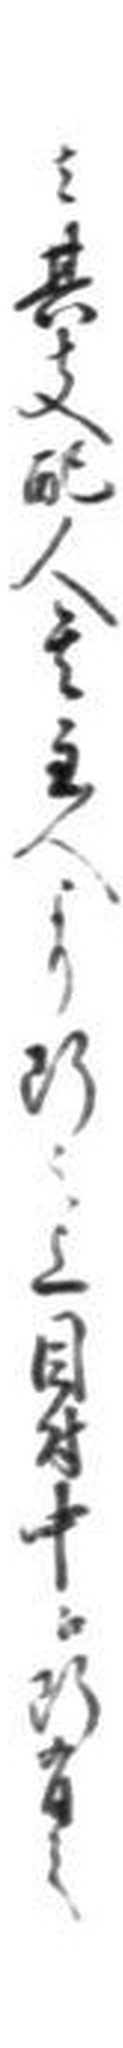者其支配人其主人より断之上目付中江断有之
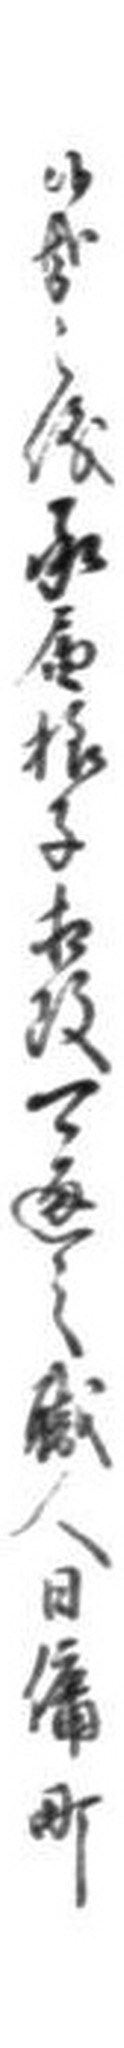候哉之儀承届様子相改可通之職人日傭町
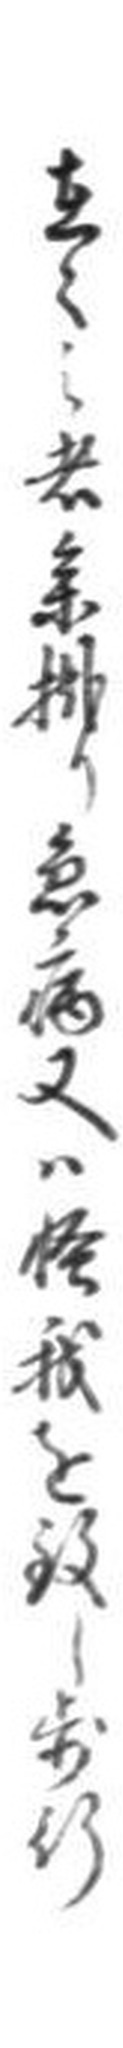在々之者参掛り急病又ハ怪我を致し歩行
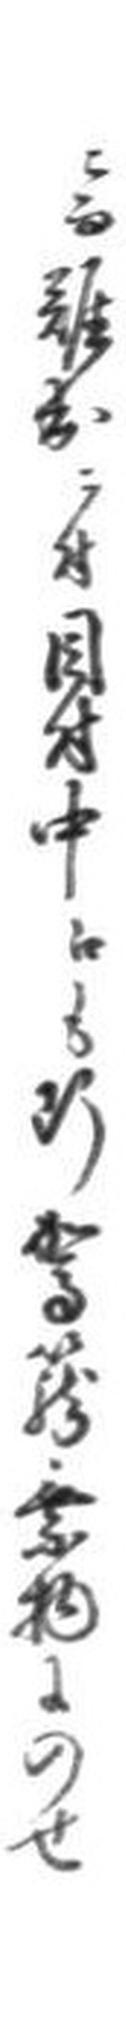ニ而難出ニ付目付中江も断駕籠乗物にのせ
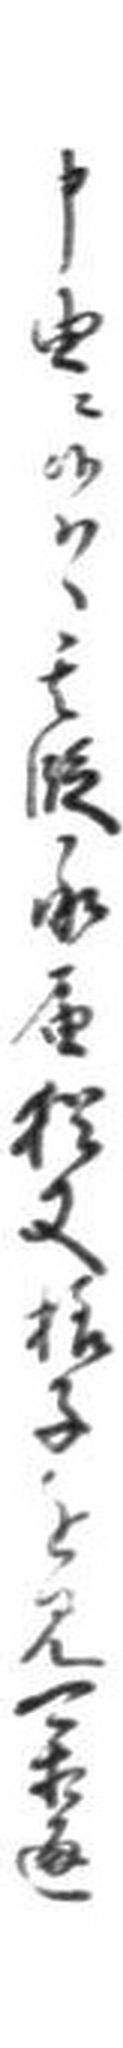申由ニ候ハヽ其段承届猶又様子を見可相通
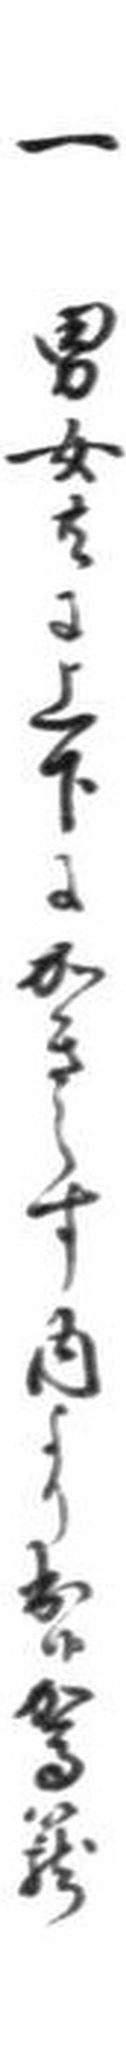一男女共に上下にかきらす内より出候駕籠

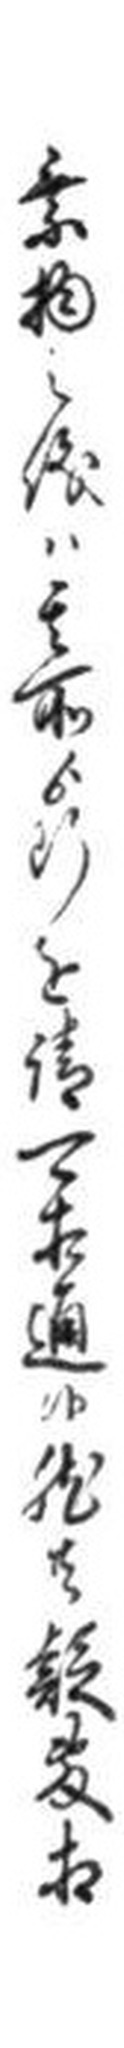乗物之儀ハ其所ゟ断を請可相通候然共疑敷相
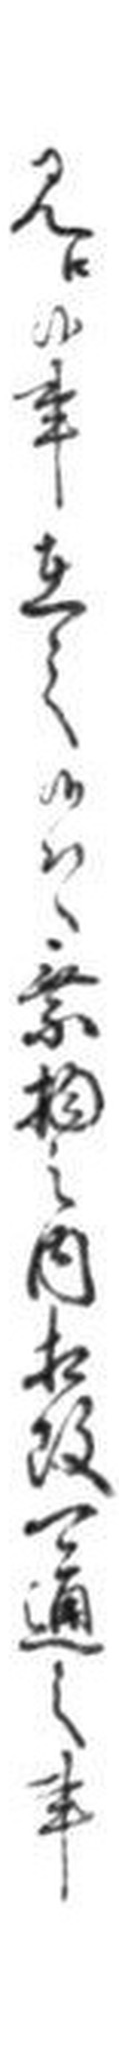見江候事在之候ハヽ乗物之内相改可通之事
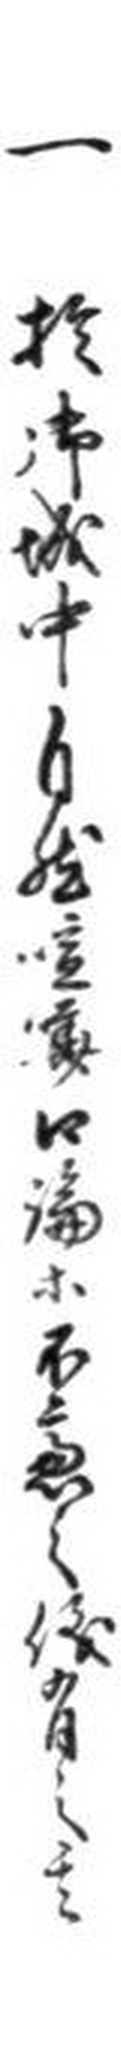一於御城中自然喧嘩口論等不慮之儀有之其
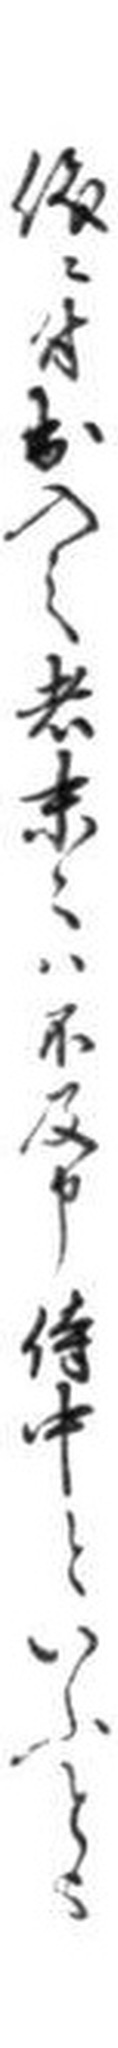儀ニ付出入之者末々ハ不及申侍中といふとも
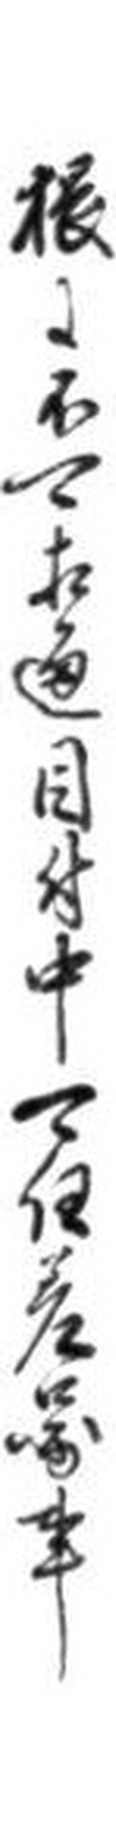猥に不可相通目付中可任差図事
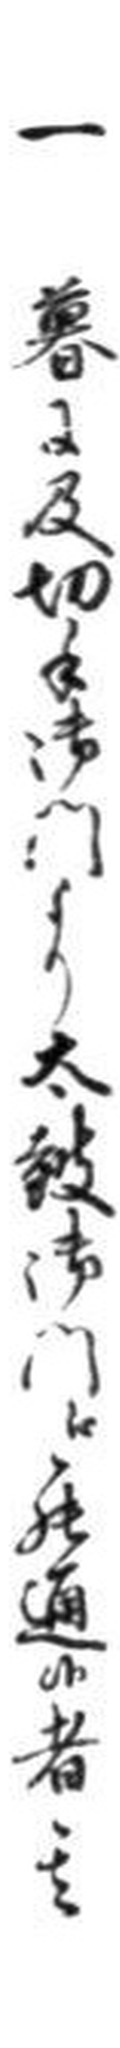一暮に及切手御門より太鼓御門江罷通候者其
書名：家譜 三十三 吉邦公 享保四年
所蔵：福井県文書館 Fukui Prefectural Archives
